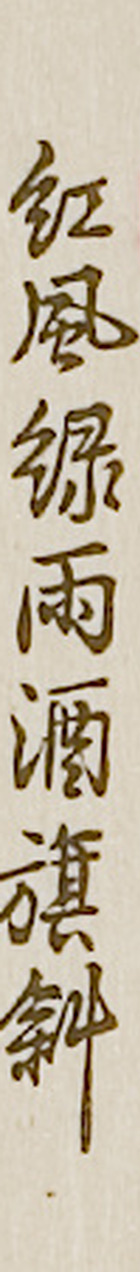紅風緑雨酒旗斜
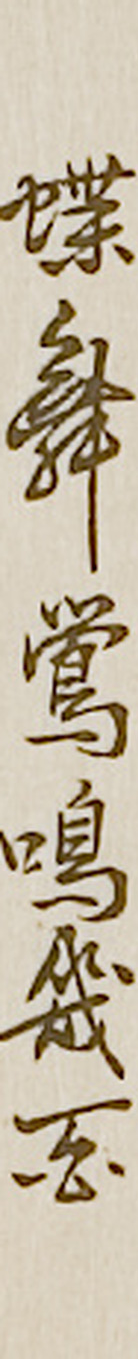蝶舞鶯鳴幾百
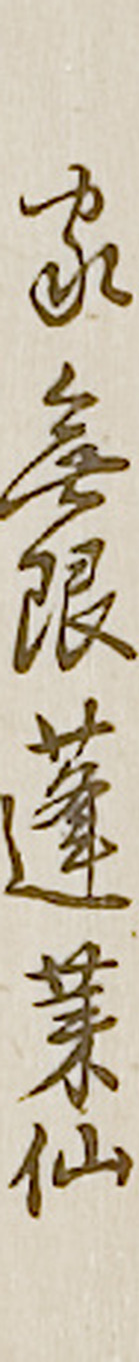家無限蓬莱仙
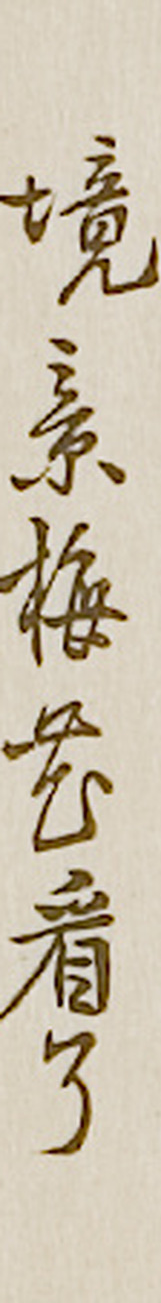境景梅花観看了
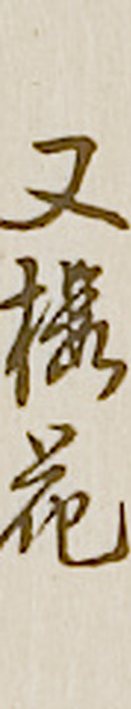又桜花
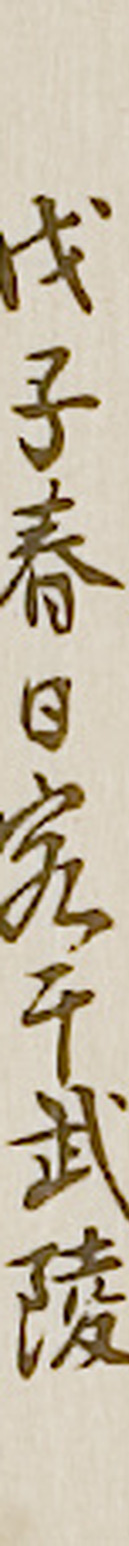戊子春日客于武陵
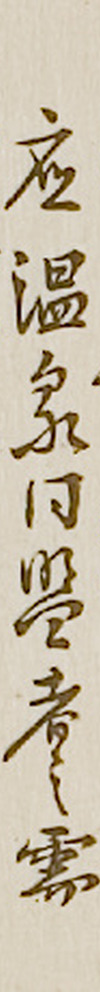底温泉同盟者之需
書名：肥前国杵島郡武雄柄崎駅温泉之真景
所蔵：東京大学総合図書館 General Library in the University of Tokyo, JAPAN
